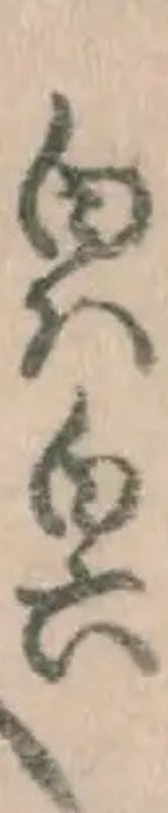白は白六
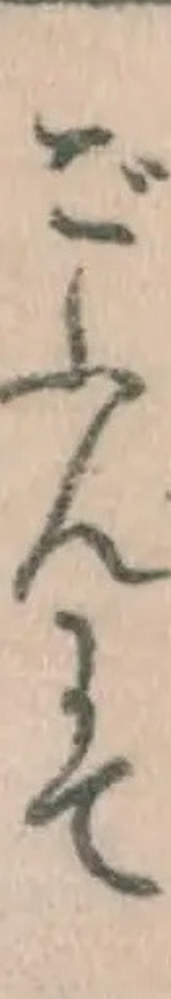ごふんにて
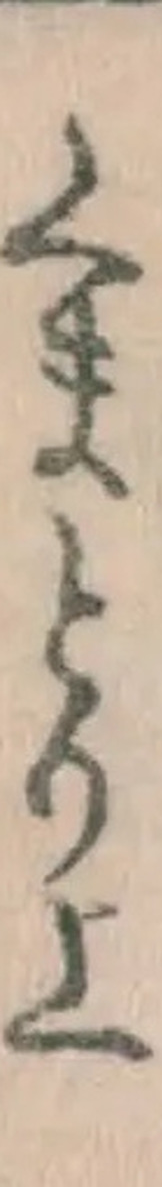くまとり上
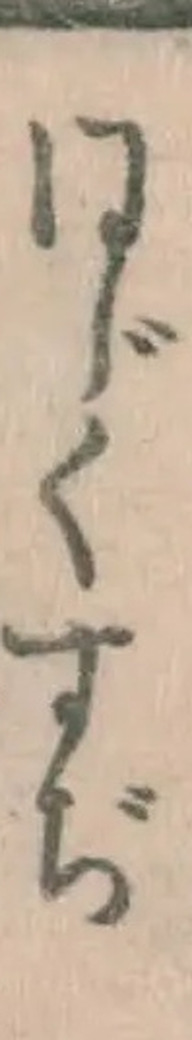同じくすぢ

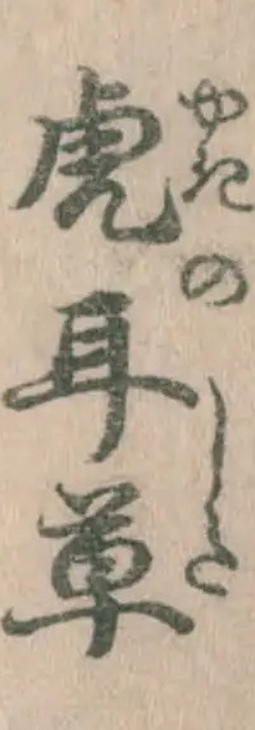虎耳草
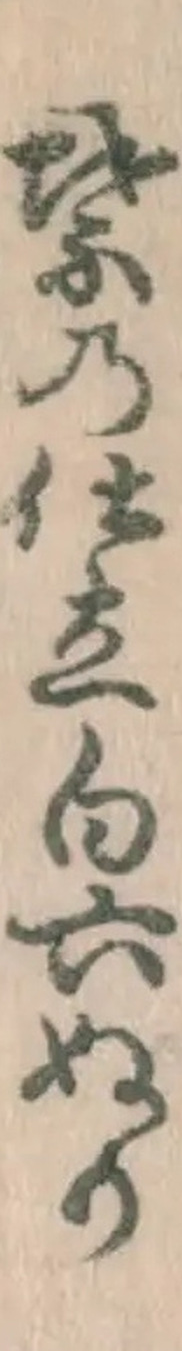葉の仕立白六ぬり
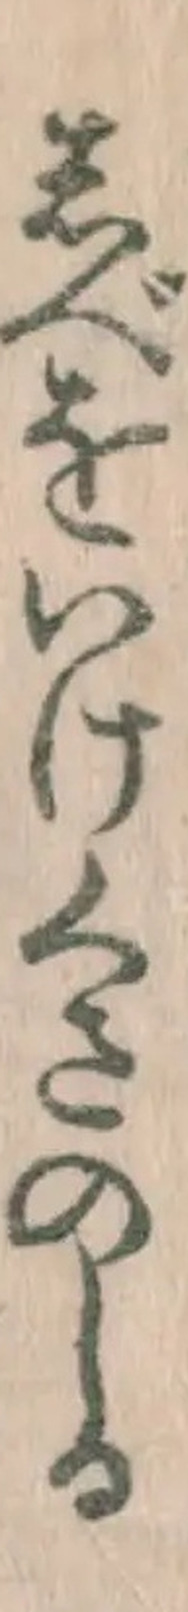しべをいけくさのしる
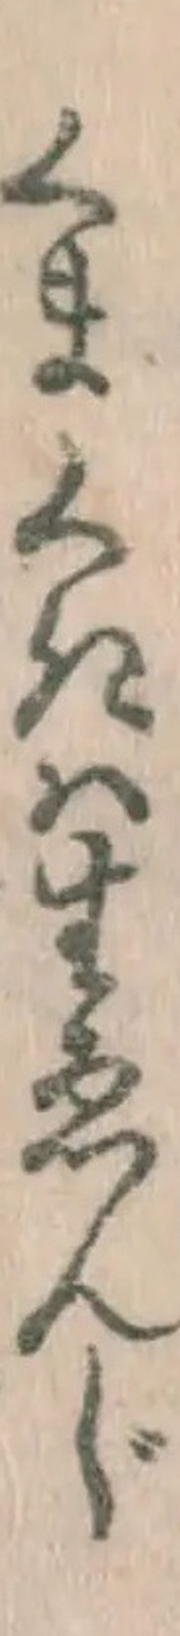くまくきは生ゑんじ
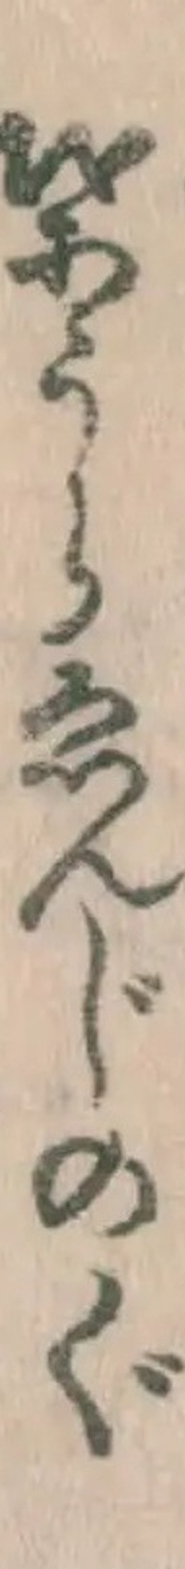葉うらゑんじのぐ
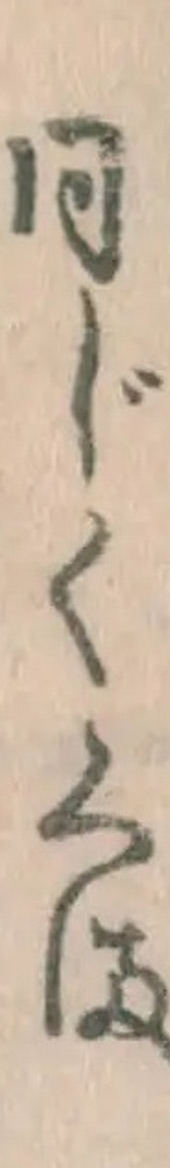同じくくま
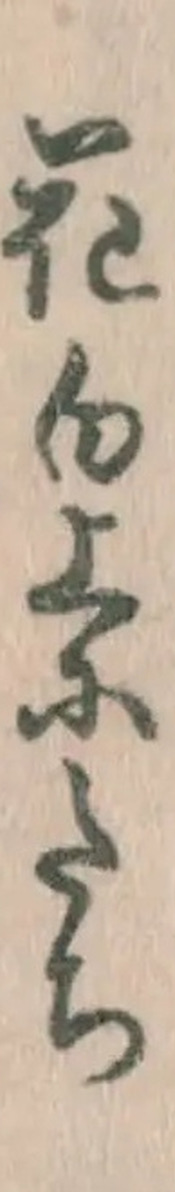花白上にたち
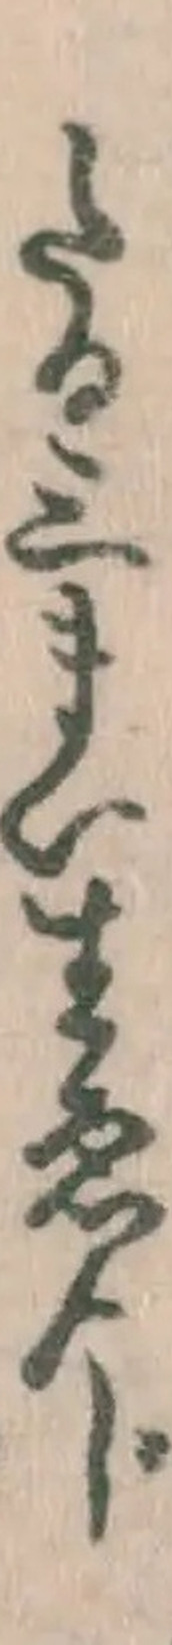たる三まい生ゑんじ
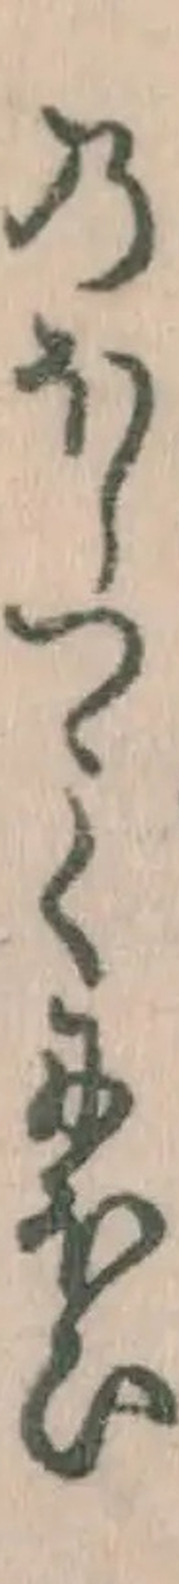のほしつゝくにほひ
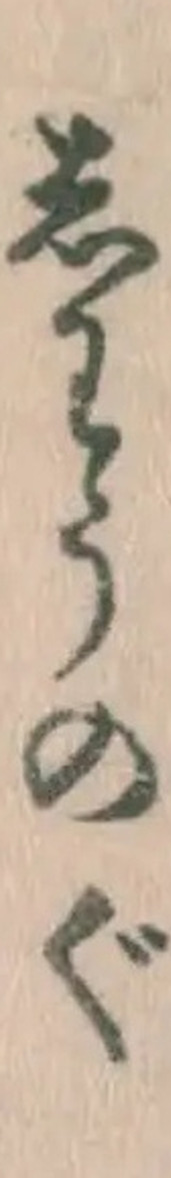しわうのぐ

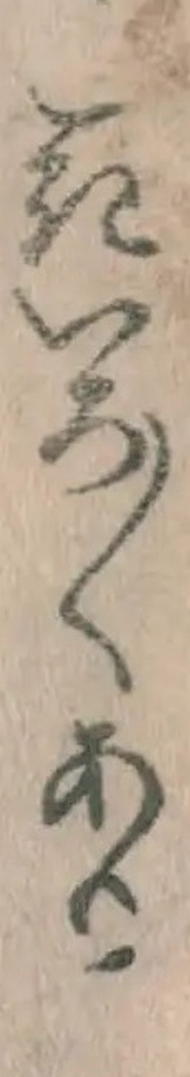桔梗花いろ〳〵あり
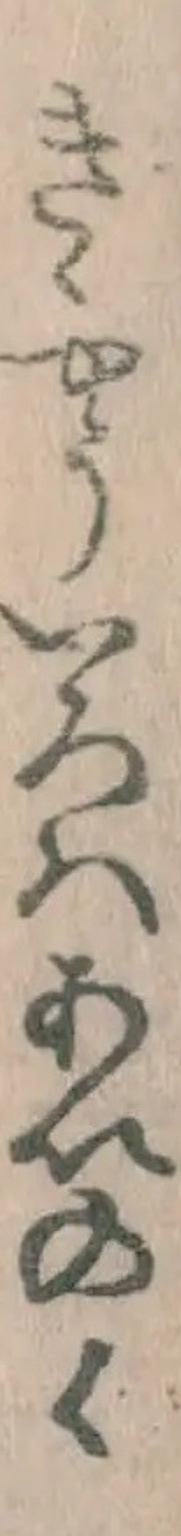きゝやういろはあいのく
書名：絵本時津艸
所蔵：国立国会図書館 National Diet Library, JAPAN
